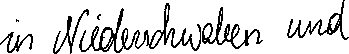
in Niederschwaben und
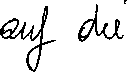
auf die
